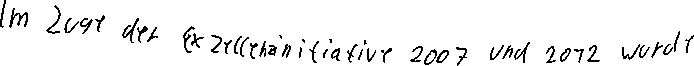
Im Zuge der Exzellenzinitiative 2007 und 2012 wurde
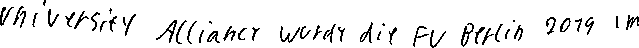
University Alliance wurde die FU Berlin 2019 im
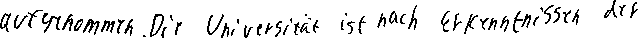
aufgenommen.Die Universität ist nach Erkenntnissen der
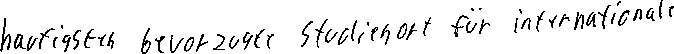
häufigsten bevorzugte Studienort für internationale
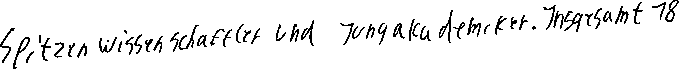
Spitzenwissenschaftler und Jungakademiker. Insgesamt 18
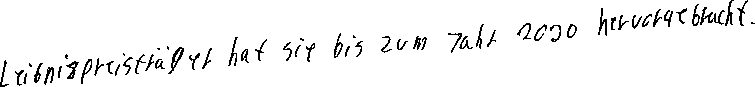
Leibnizpreisträger hat sie bis zum Jahr 2020 hervorgebracht.
